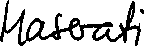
Maserati
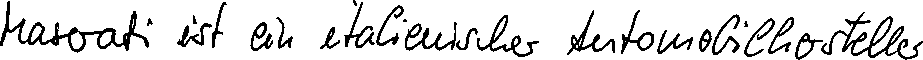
Maserati ist ein italienischer Automobilhersteller
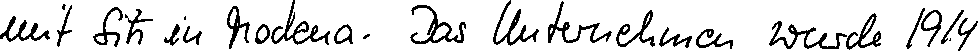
mit Sitz in Modena. Das Unternehmen wurde 1914
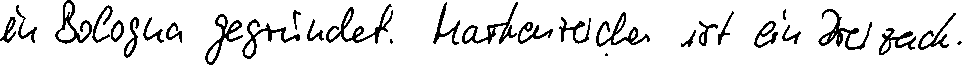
in Bologna gegründet. Markenzeichen ist ein Dreizack.
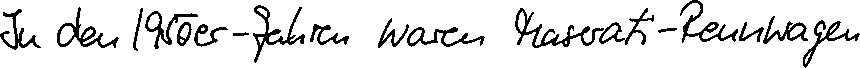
n den 1950er-Jahren waren Maserati-Rennwagen
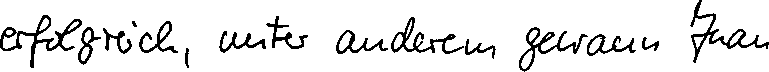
erfolgreich, unter anderem gewann Juan
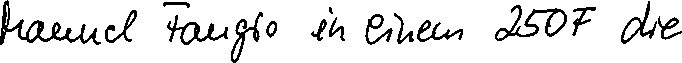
Manuel Fangio in einem 250F die
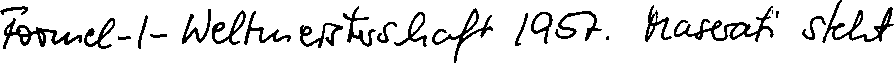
Formel-1-Weltmeisterschaft 1957. Maserati steht
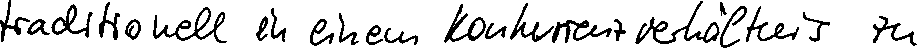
traditionell in einem Konkurrenzverhältnis zu
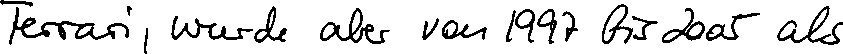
Ferrari, wurde aber von 1997 bis 2005 als
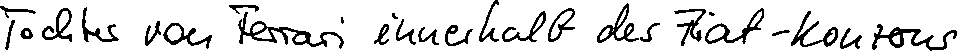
Tochter von Ferrari innerhalb des Fiat-Konzerns
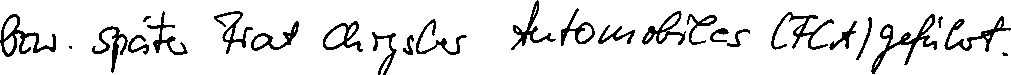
bzw. später Fiat Chrysler Automobiles (FCA) geführt.
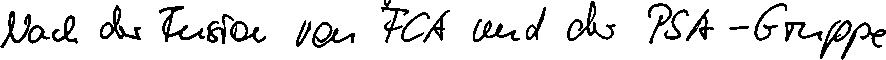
Nach der Fusion von FCA und der PSA-Gruppe
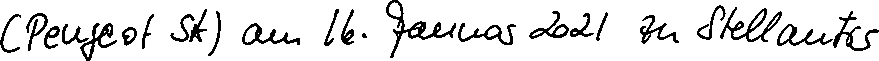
(Peugeot SA) am 16. Januar 2021 zu Stellantis
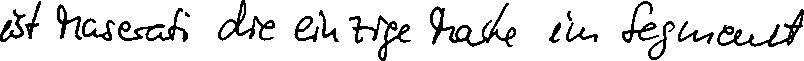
ist Maserati die einzige Marke im Segment
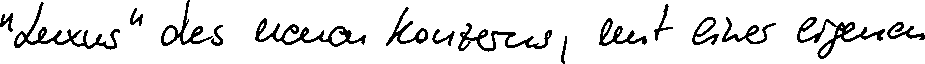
"Luxus" des neuen Konzerns, mit einer eigenen
